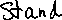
Stand
